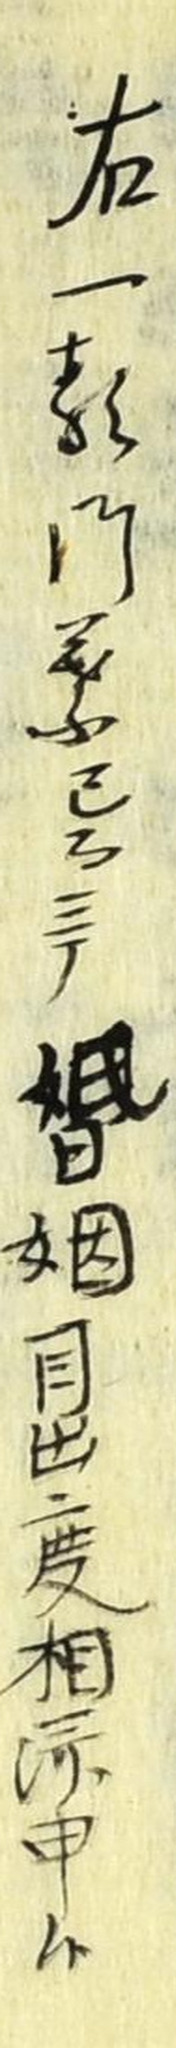右一類門葉已而ニテ婚姻目出度相済申候
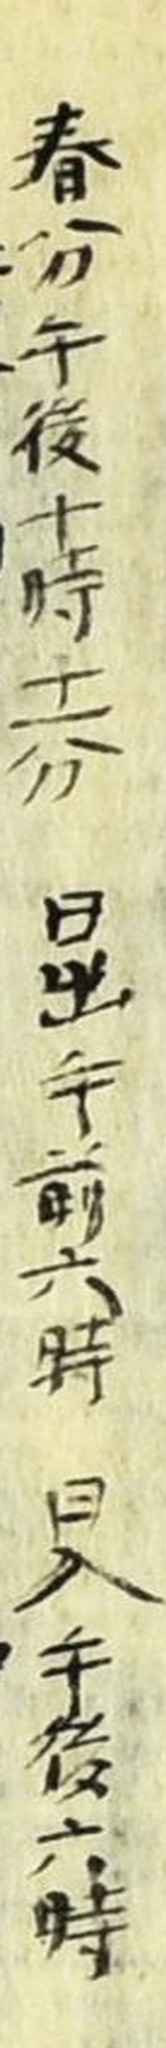春分午後十時十一分日出午前六時日入午後六時
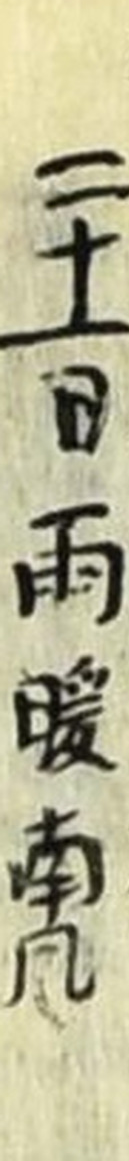二十一日雨暖南風中
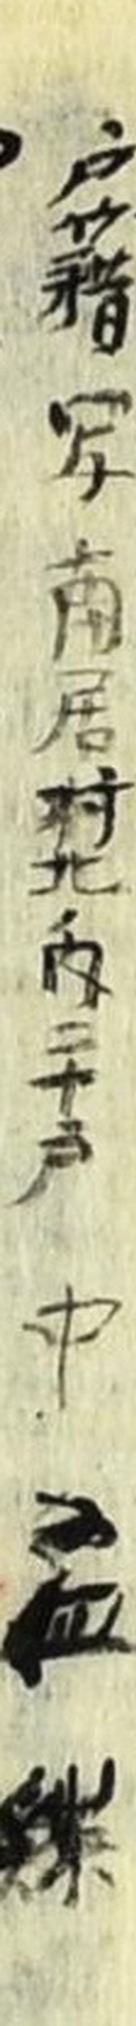戸籍写南居村北ノ内二十戸中鰈
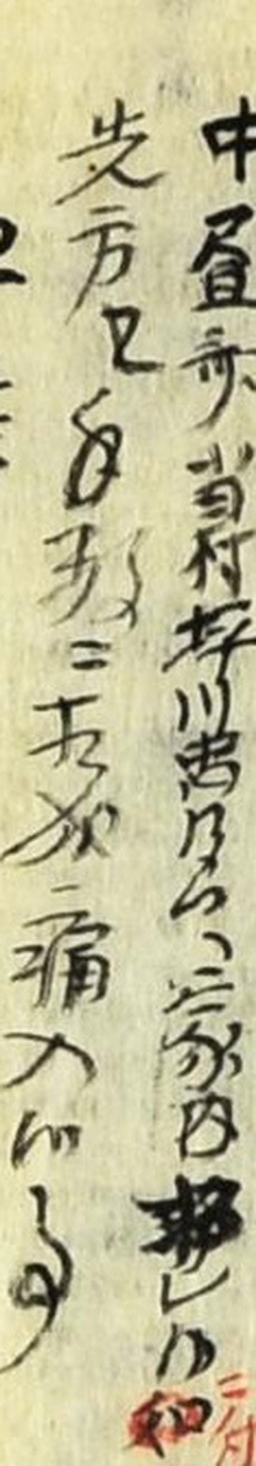先方之手数ニ相成痛入候事
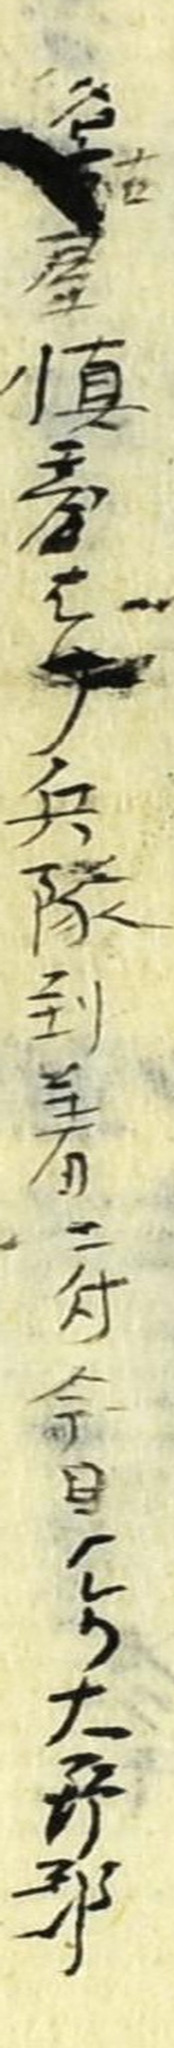名古屋鎮台与り兵隊到着ニ付今日ヨリ大野郡
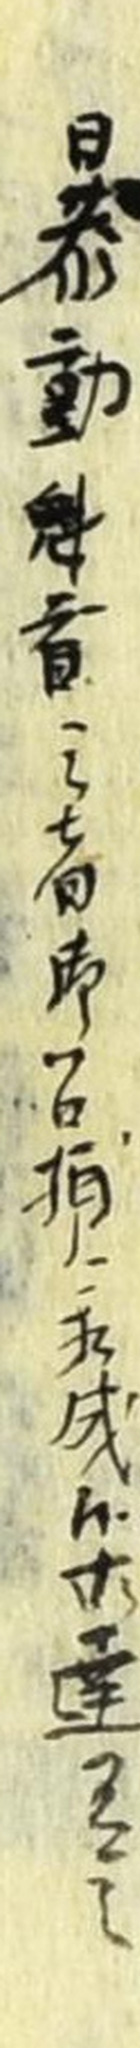暴動魁首之者御召捕ニ相成候御達有之
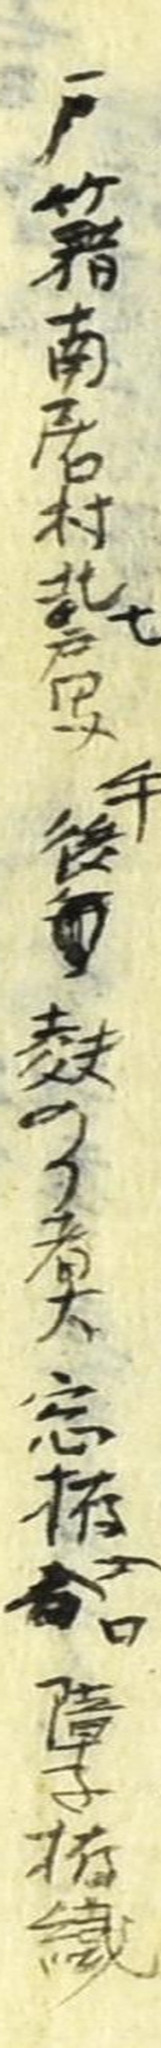戸籍南居村北七戸写午後麩のり煮窓拵入口障子拵織
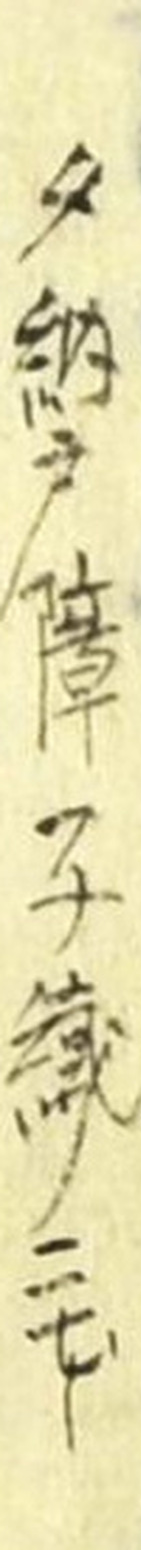夕納戸障子織二本

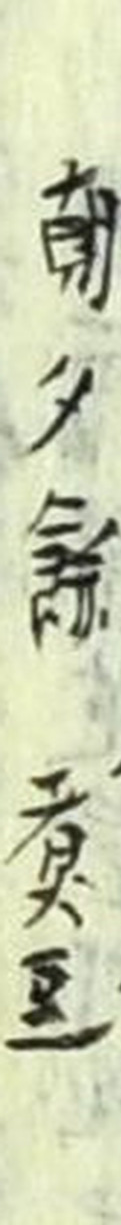朝夕餅煮豆
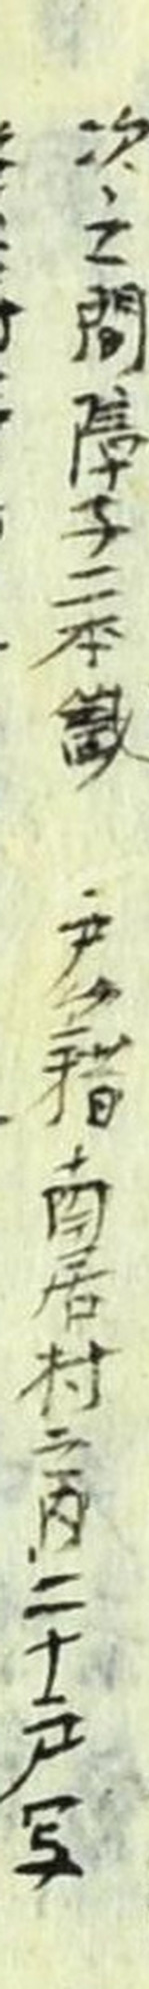次之間障子二本織戸籍南居村之内二十戸写
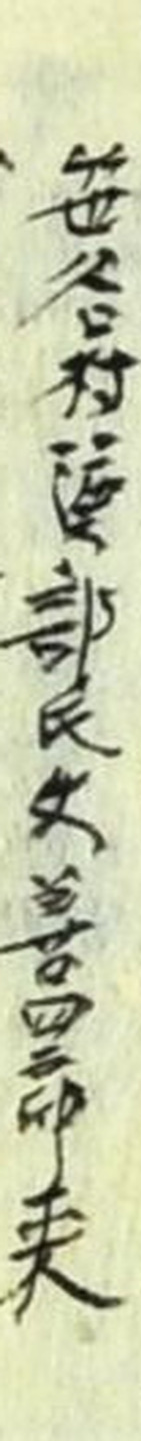笹谷村渡部氏父善四郎来
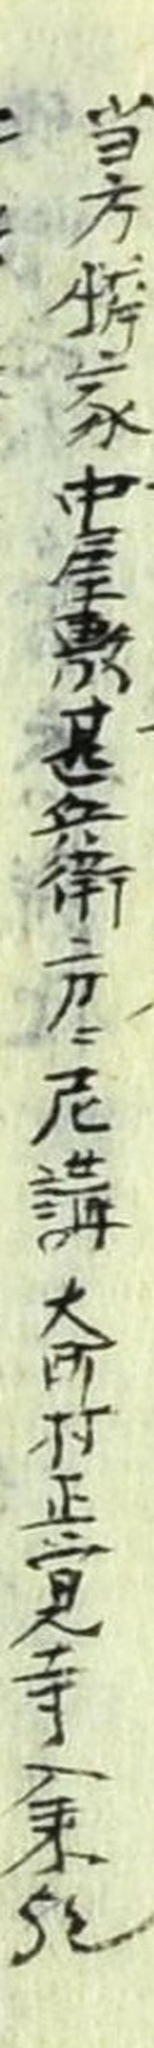当方憐家中屋敷甚兵衛方ニ尼講大町村正覚寺入来歟
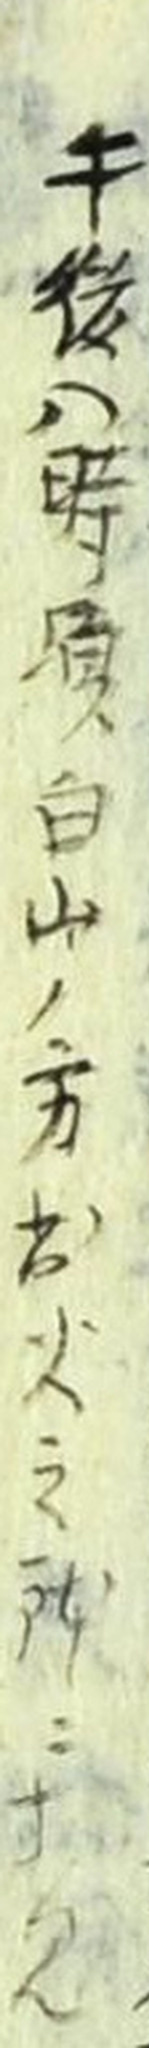午後八時頃白山ノ方出火之体ニ相見申候
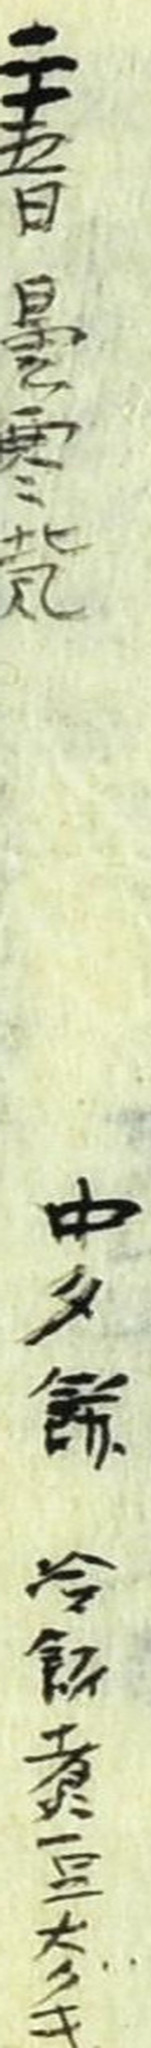二十五日曇寒北風中夕餅冷飯煮豆大グキ
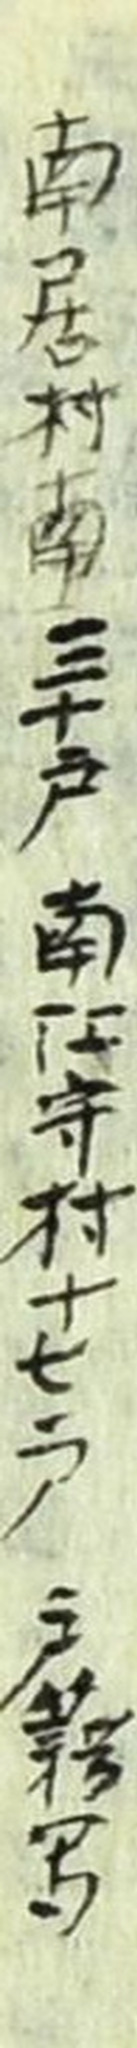南居村南三十戸南江守村十七戸戸籍写
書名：（日記）
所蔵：福井県文書館 Fukui Prefectural Archives
